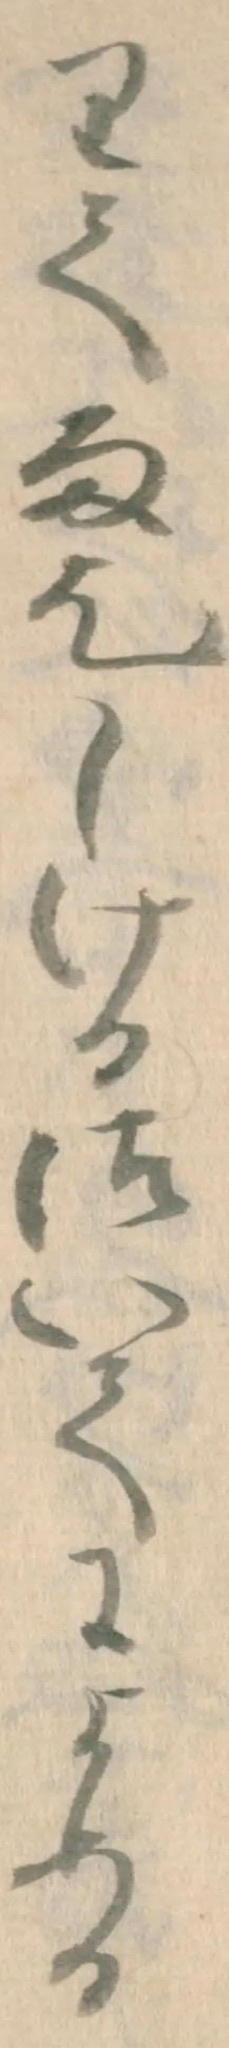りて雨乞しけるついてによめる
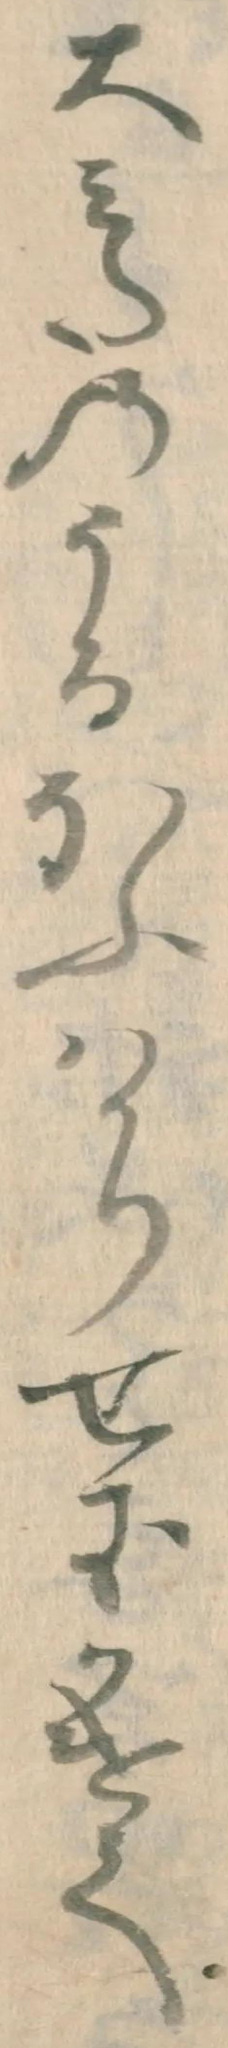大みたのうるほふはかりせにかけて
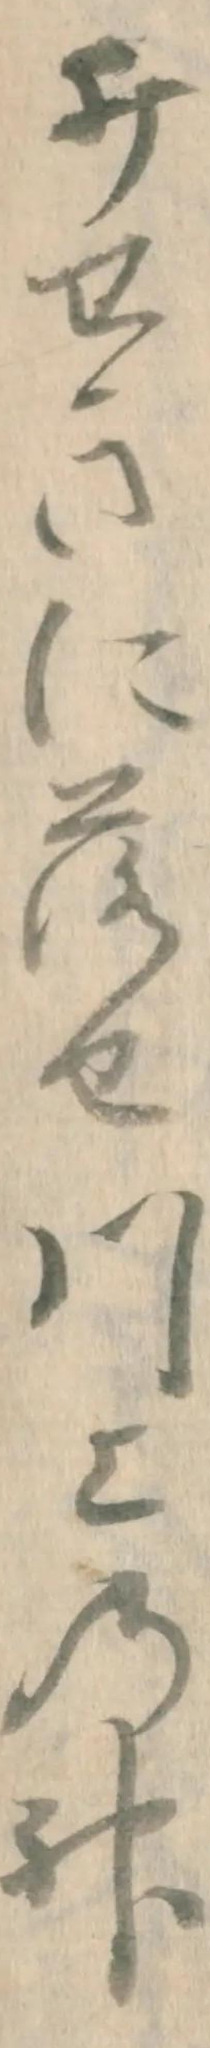ゐせきに落せ川上の神

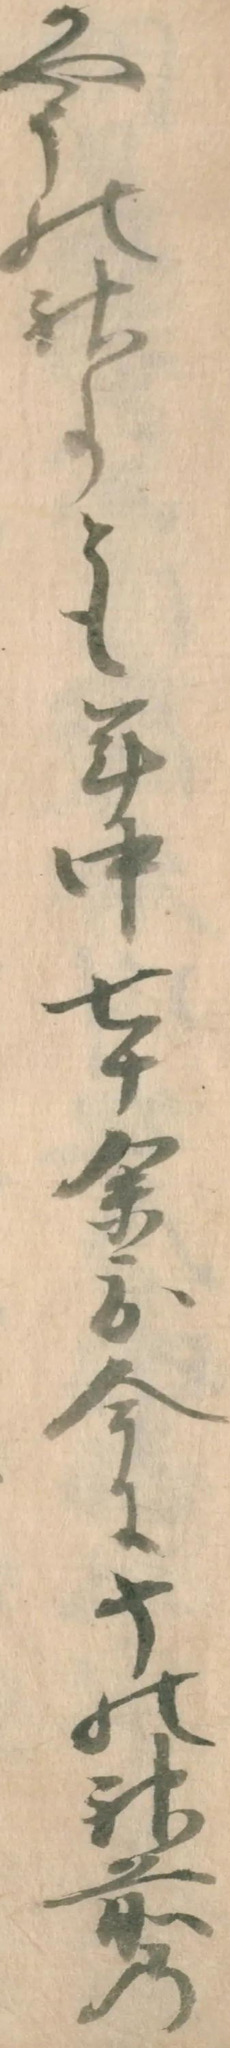かやうの神事とも年中七十余度今にその神前の
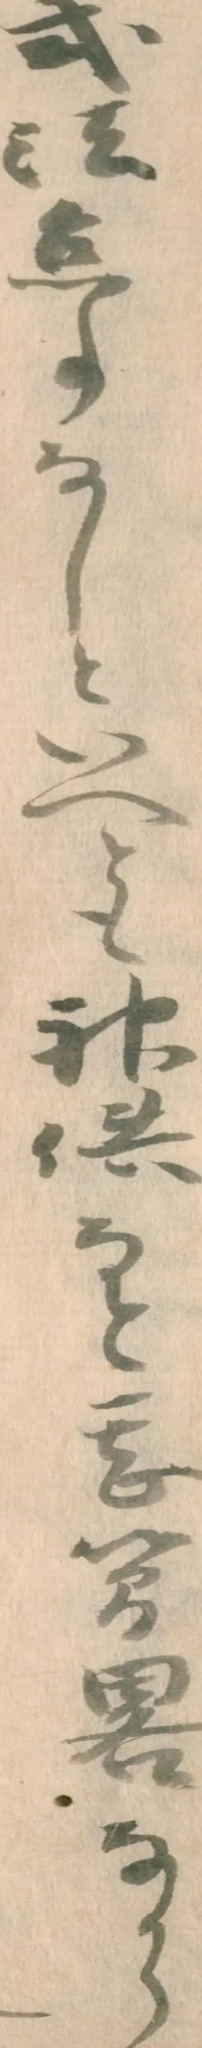式法怠事なしといへとも神供なと甚簡略なから
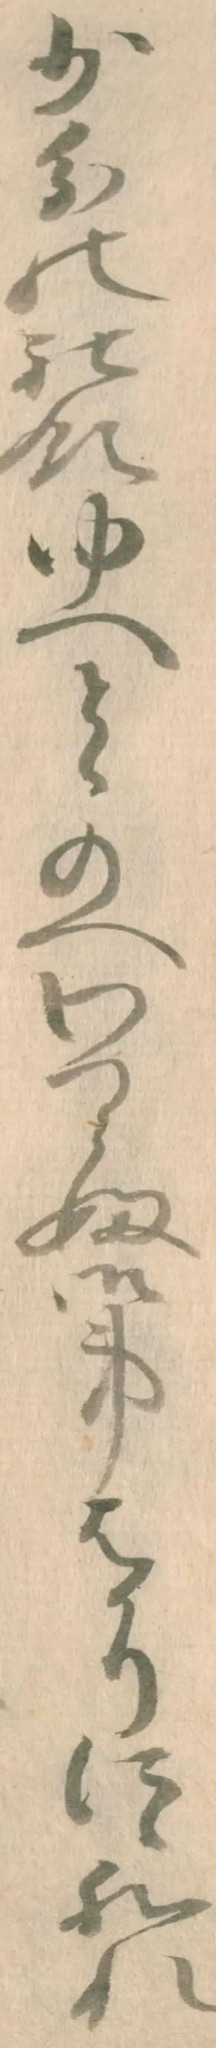少分の社領ゆへとゝのへわつらぬ御事はかりに候然れ
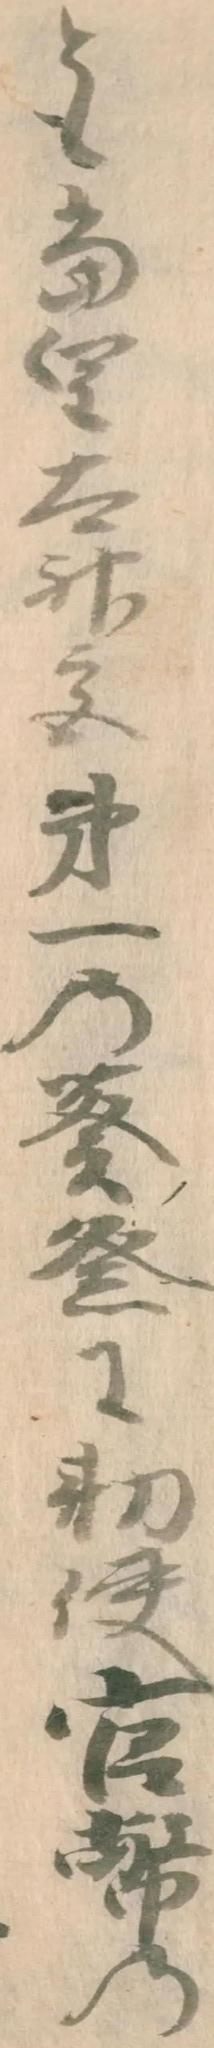とも当皇太神宮第一の葵祭に勅使官幣の
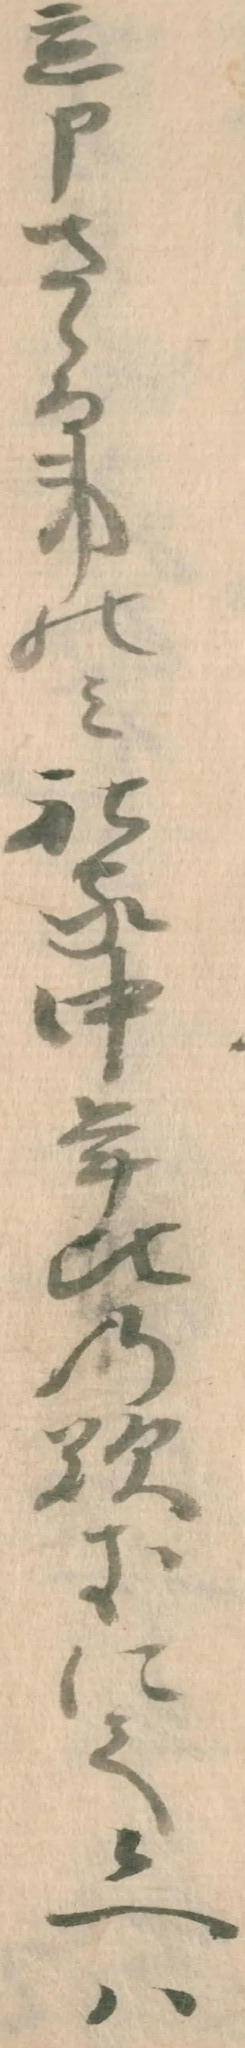立申さゝる事のみ社家中年比の歎きにて候へは
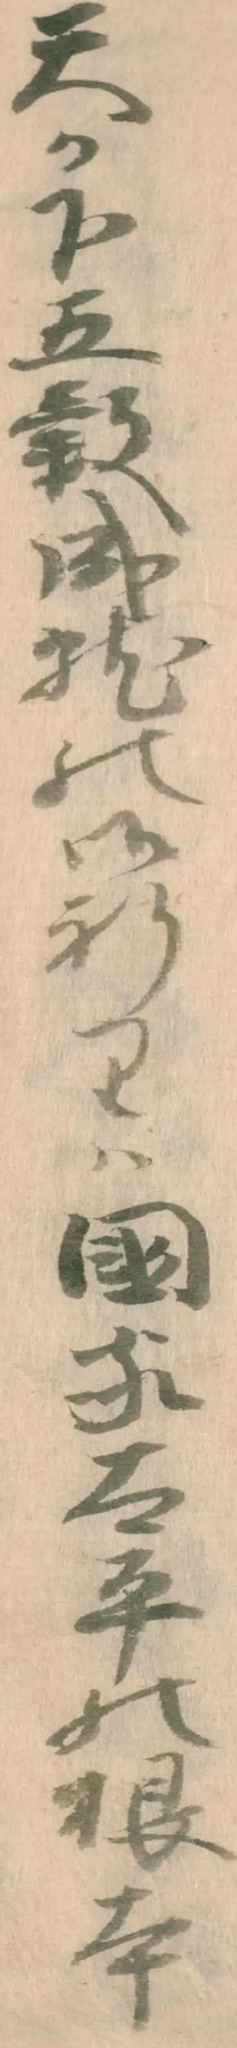天か下五穀成就の御祈りは国家太平の根本
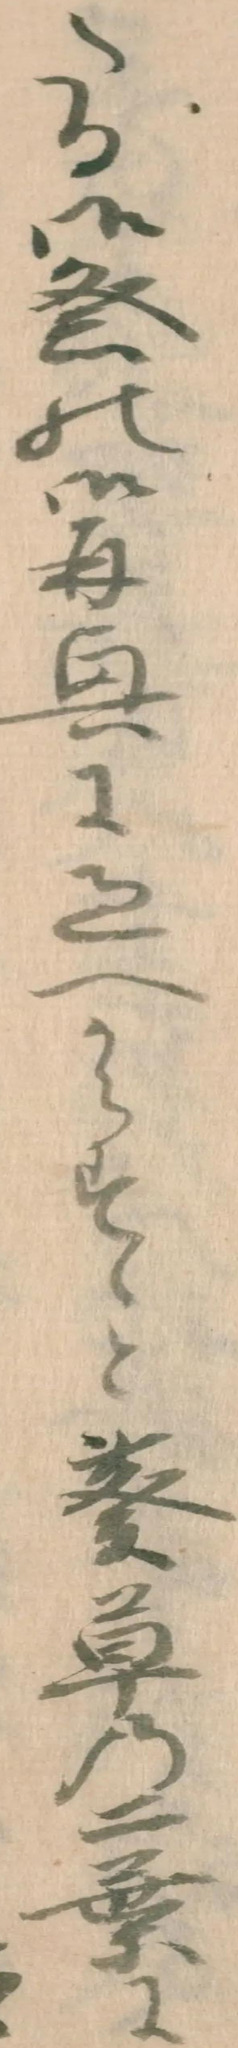たる御祭の御再興に過へからす候と葵草の二葉に
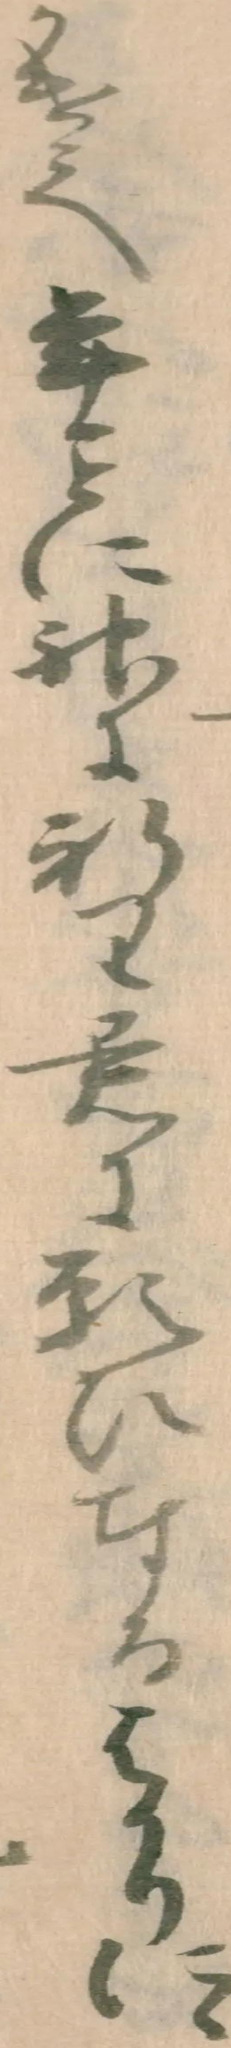かけて年ことに神に祈り君に願ひ奉るはかりに候
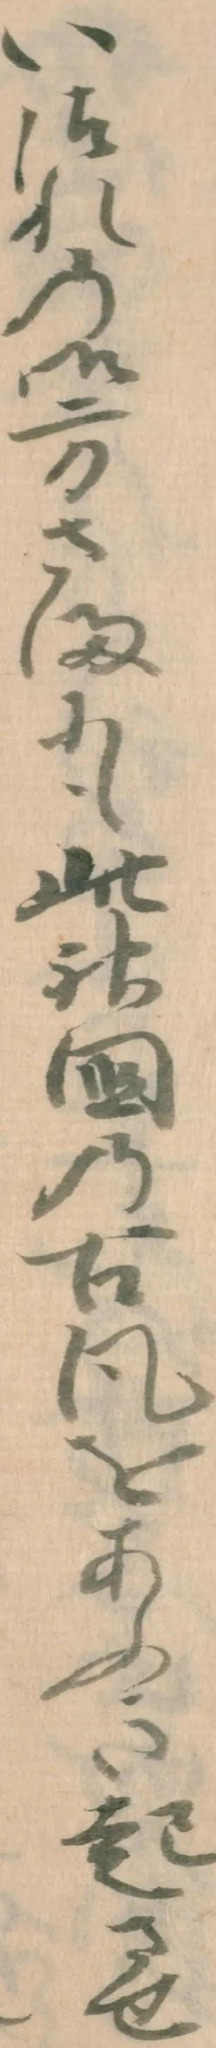いつれの御-方さまにも此神国の古風をあふき起させ
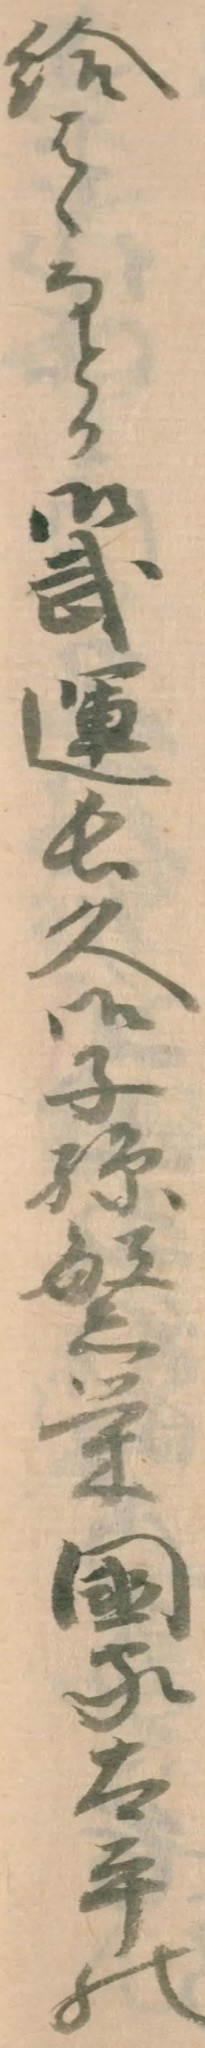給はゝなとか御武運長久御子孫繁栄国家太平の
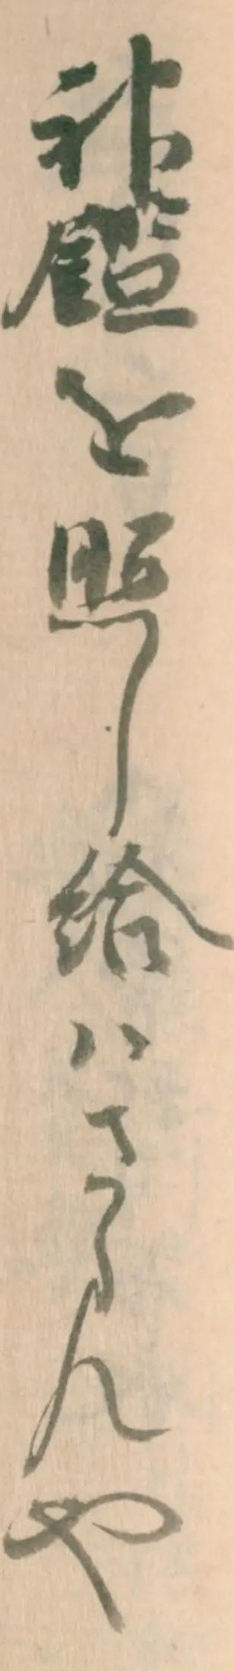神鑑を照し給はさらんや
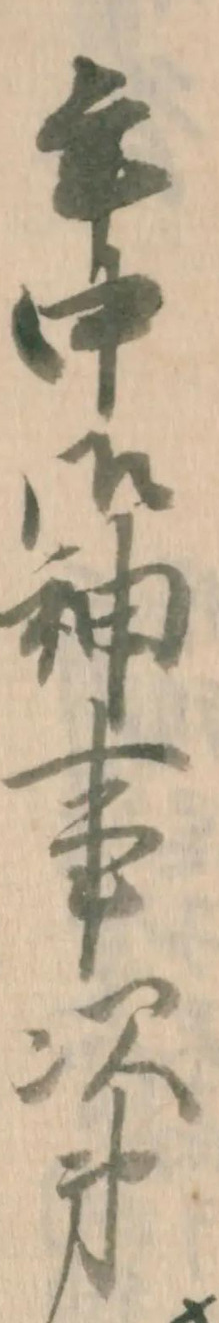年中御神事次第
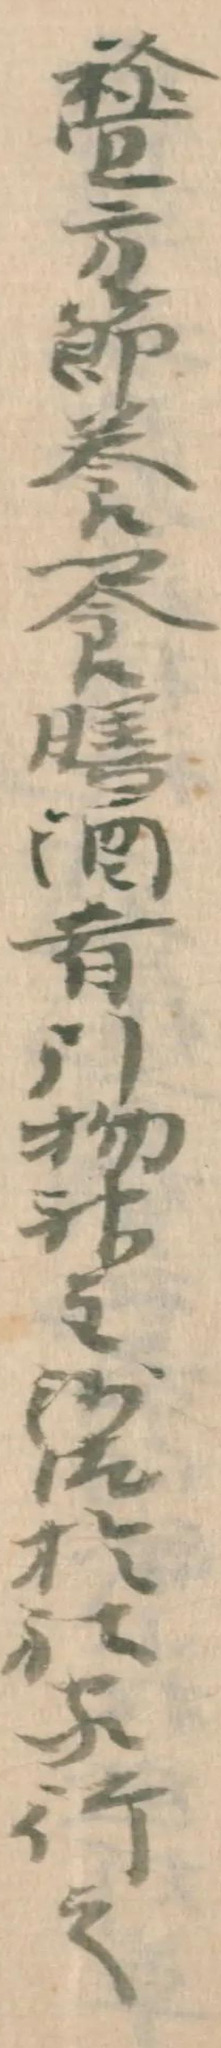二日祢宜方節養饗膳酒肴引物神主沙汰於社家行之
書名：賀茂社記録. 第1冊
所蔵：国立国会図書館 National Diet Library, JAPAN
